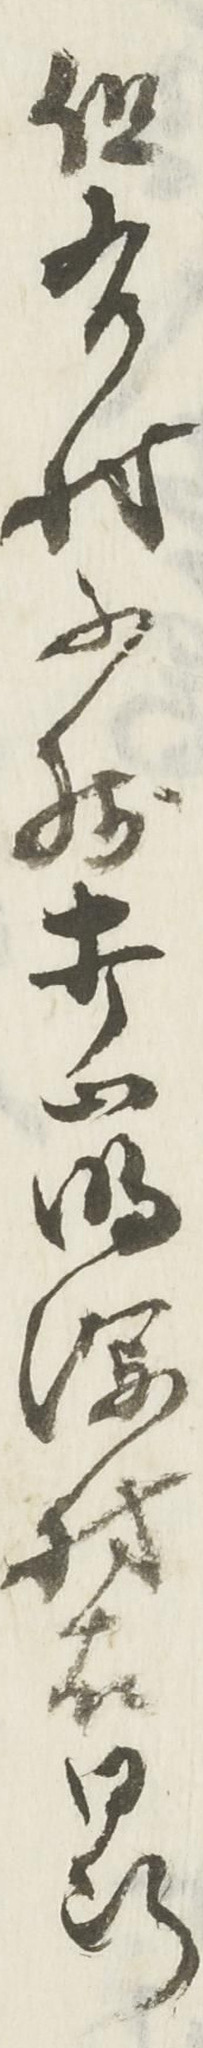但右村ふ残打崩潟村右同断
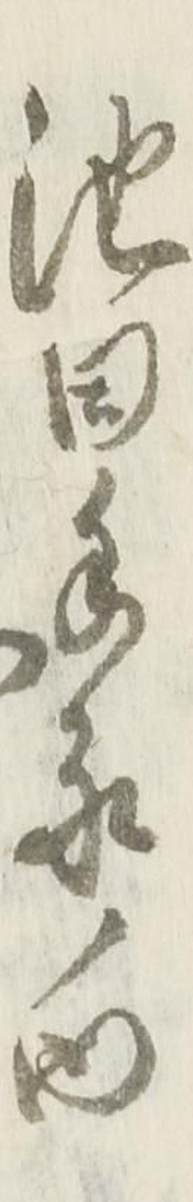池田手永の内
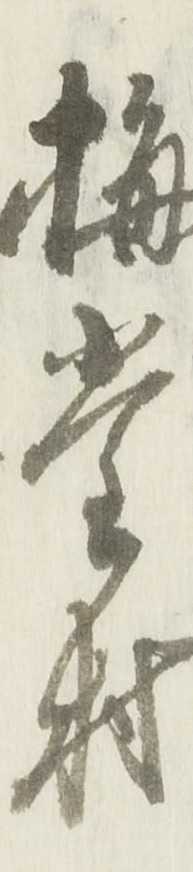梅堂村
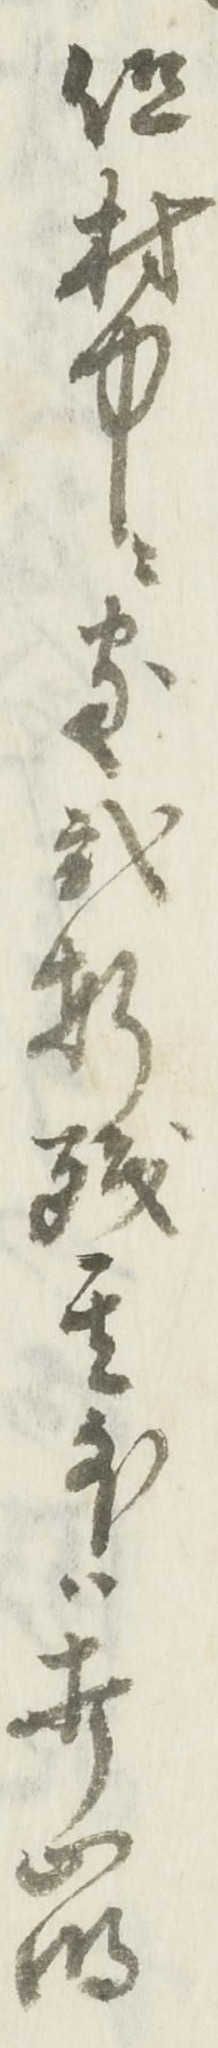但村中ニ家弐軒残其外ハ打崩
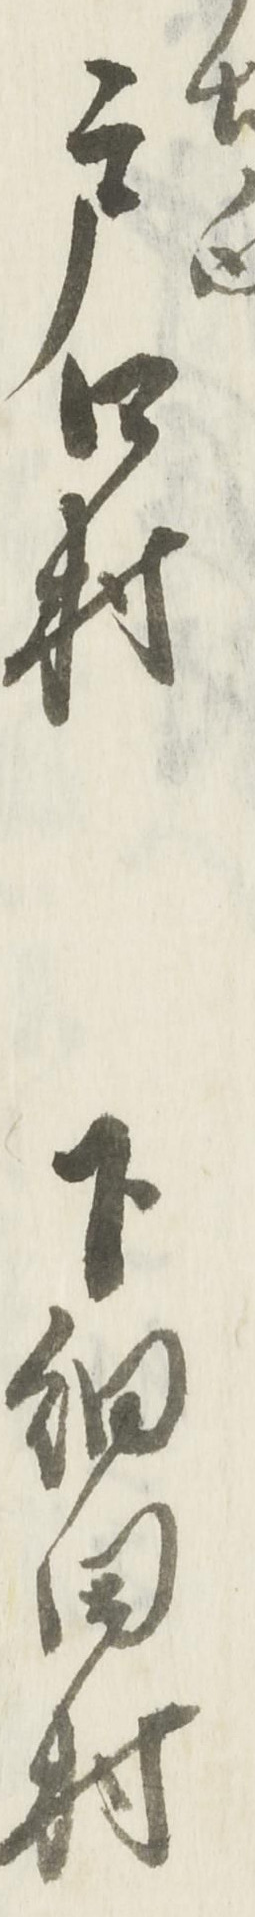戸口村下細田村
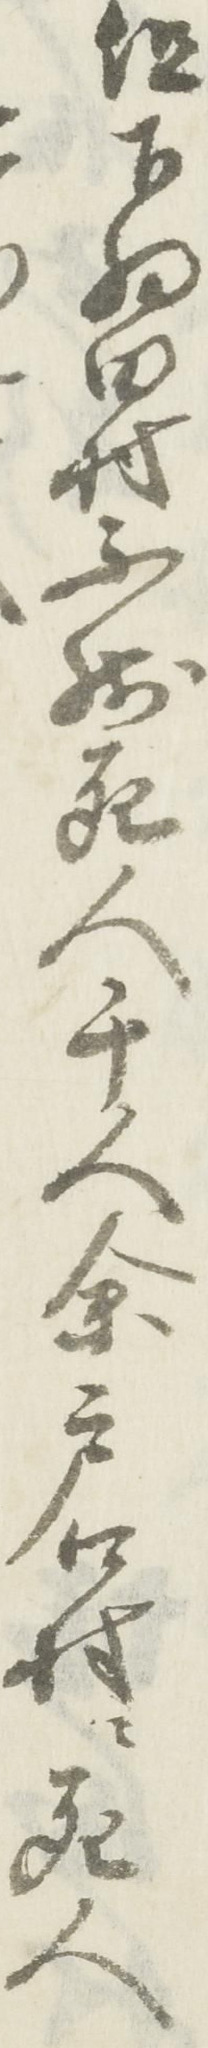但下細田村不残死人千人余戸口村ニ死人
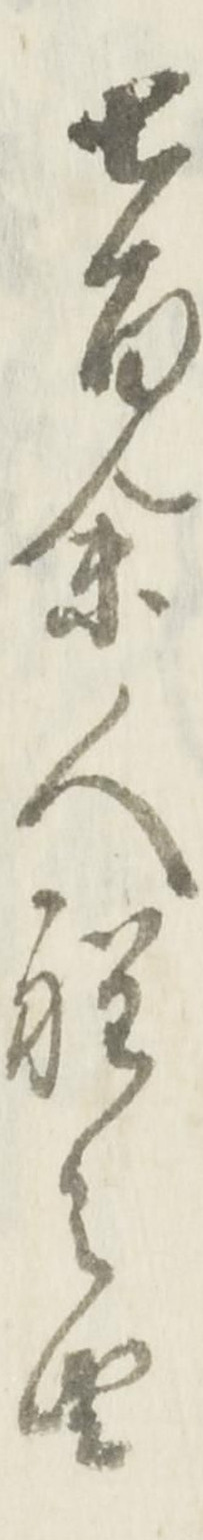七百余人程の由
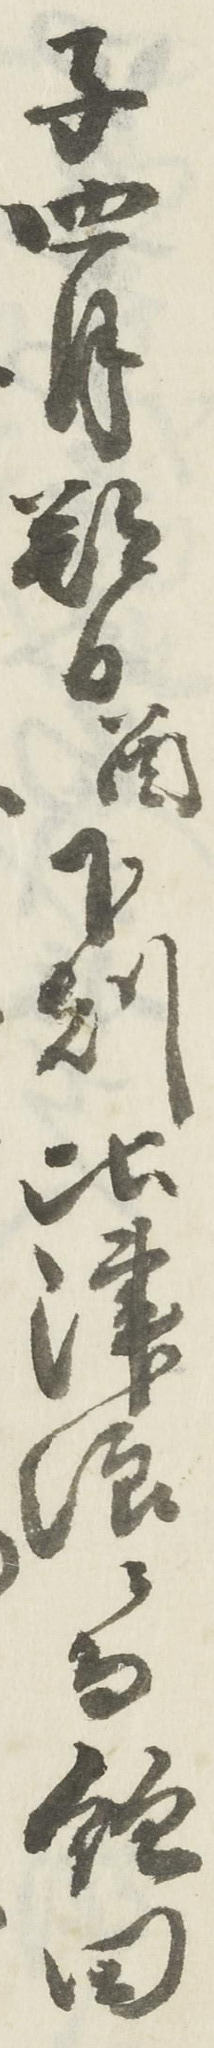子四月朔日酉下刻此津浪ニ而飽田
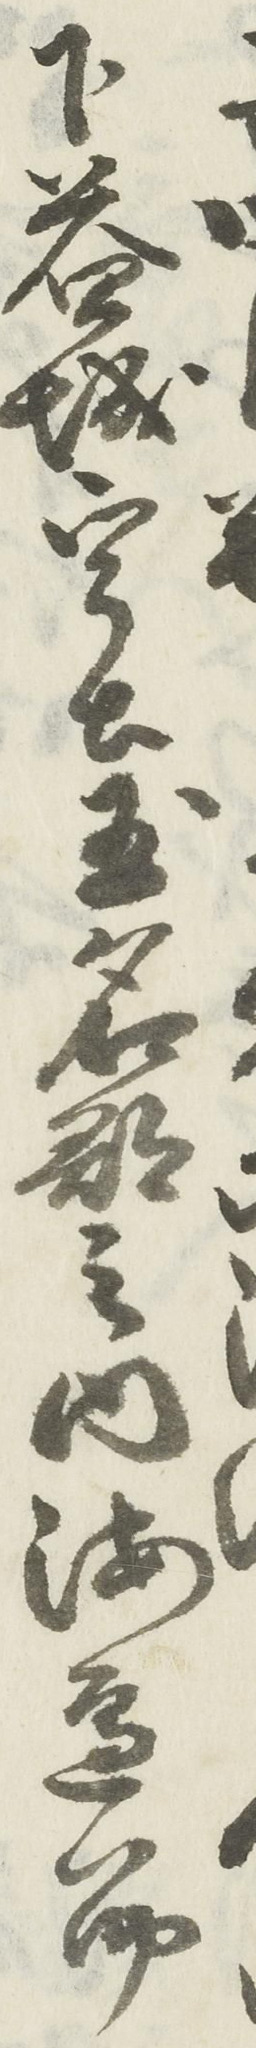下益城宇土玉名郡の内海辺筋
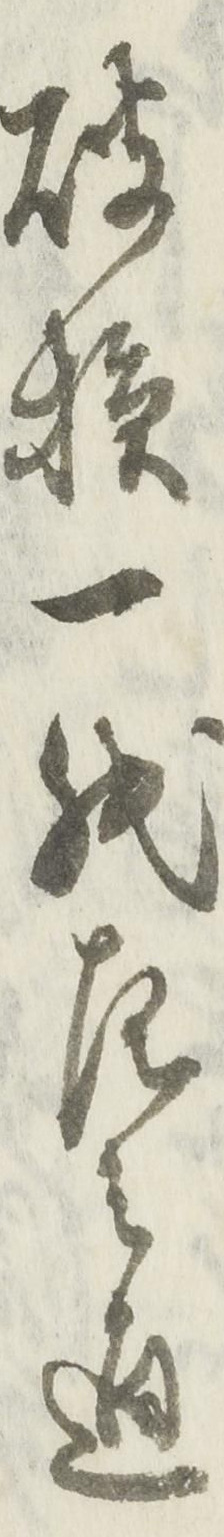破損一紙左の通
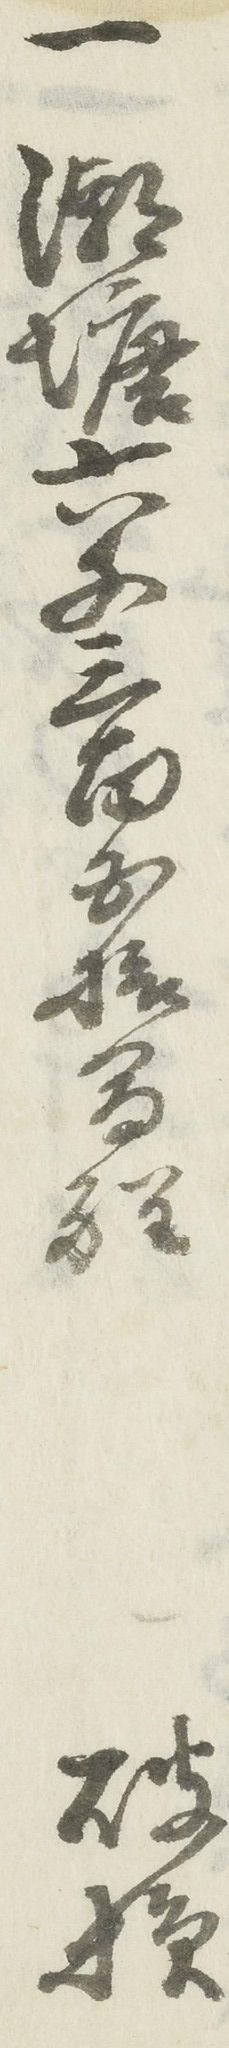一潮塘六千三百五拾間程破損
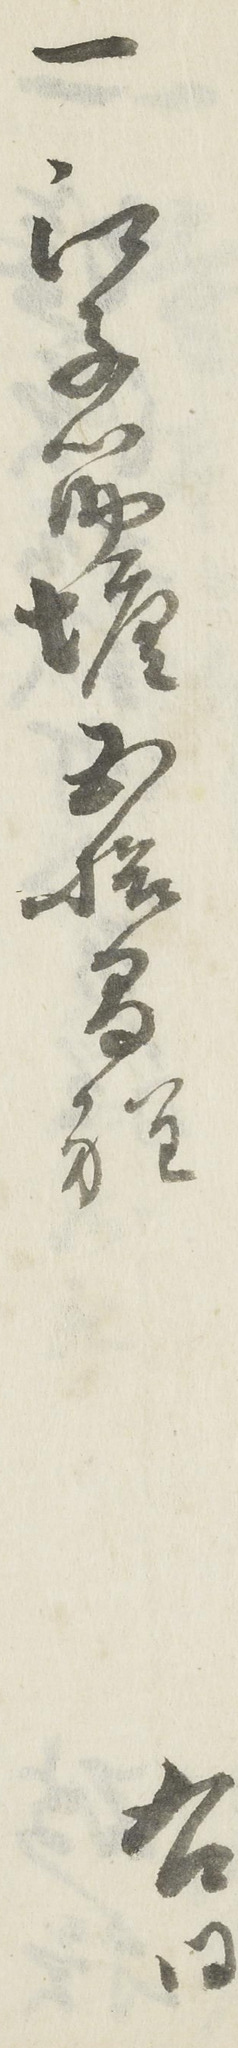一江子筋塘五拾間程右同
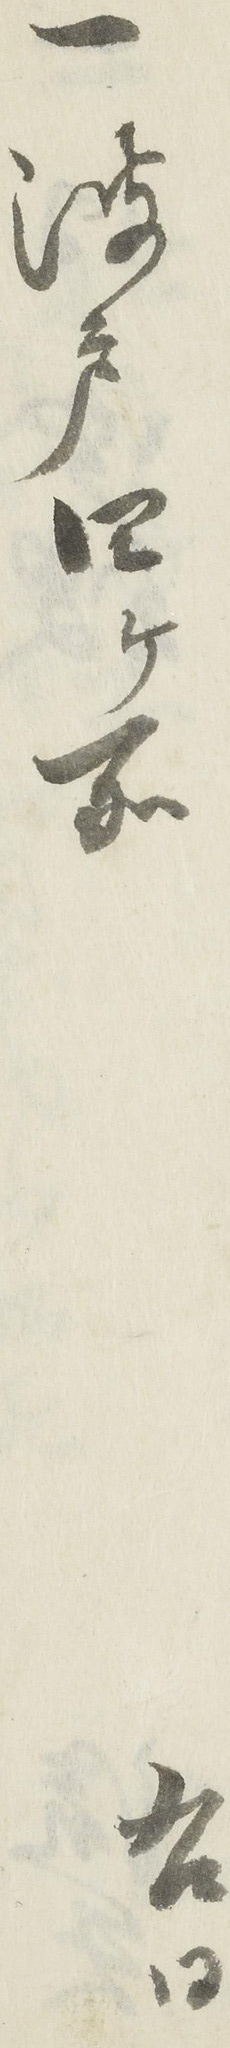一波戸四ケ所右同
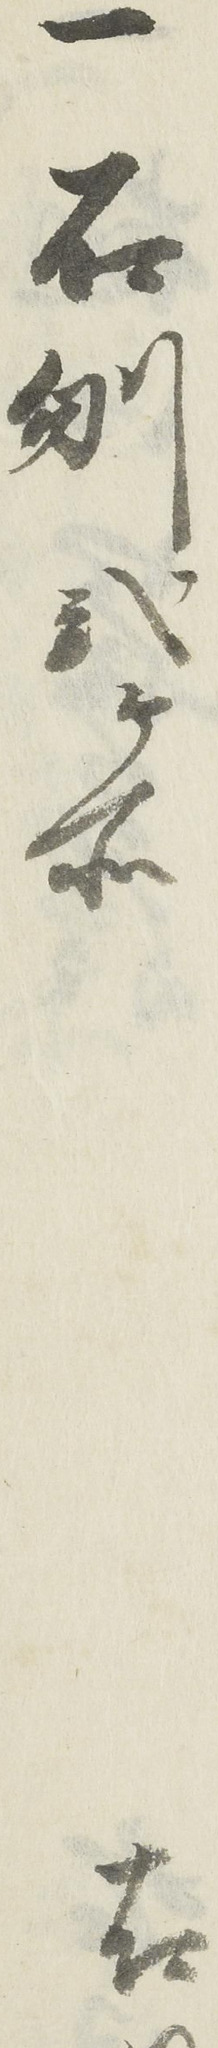一石刎弐ケ所右同

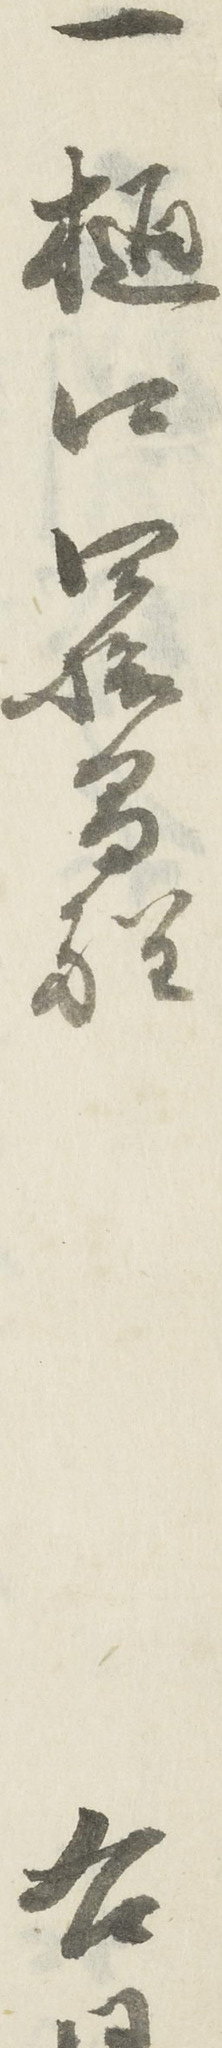一樋口四拾間程右同
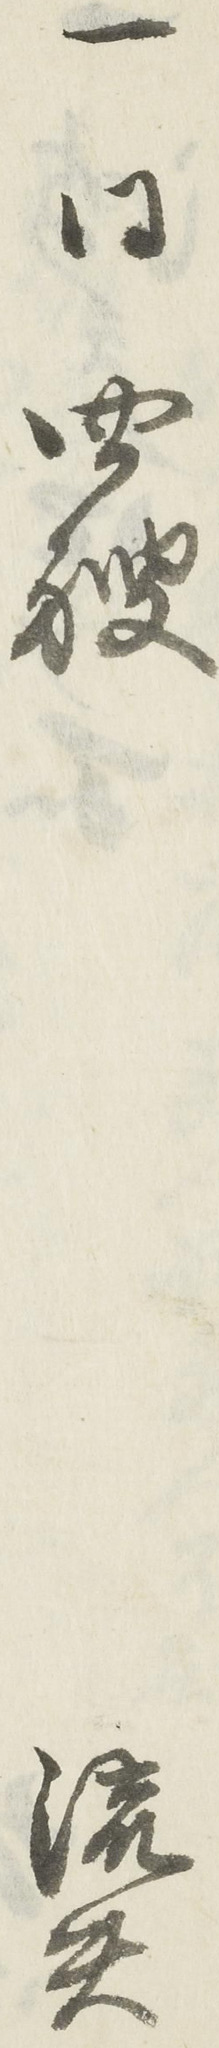一同四艘流失
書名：後見笑
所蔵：東京大学地震研究所図書室 Earthquake Research Institute Library, The University of Tokyo, JAPAN
